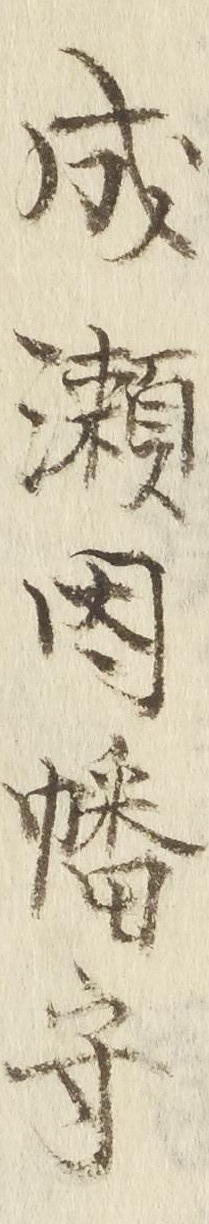成瀬因幡守

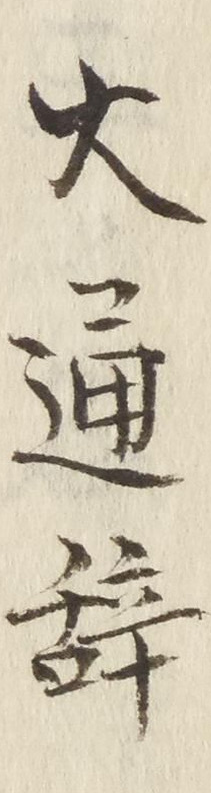大通辞
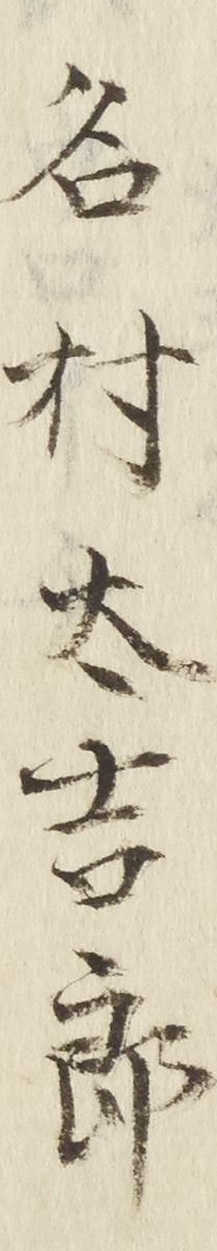名村太吉郎
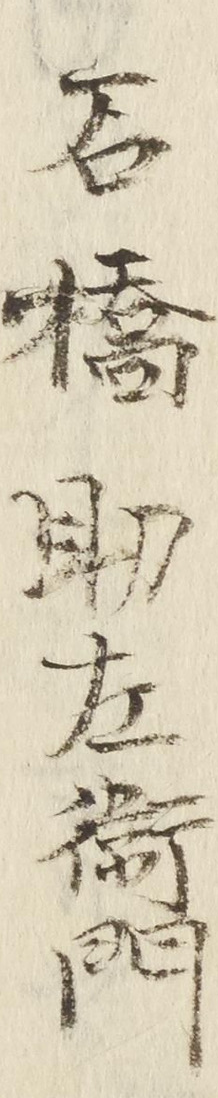石橋助左衛門
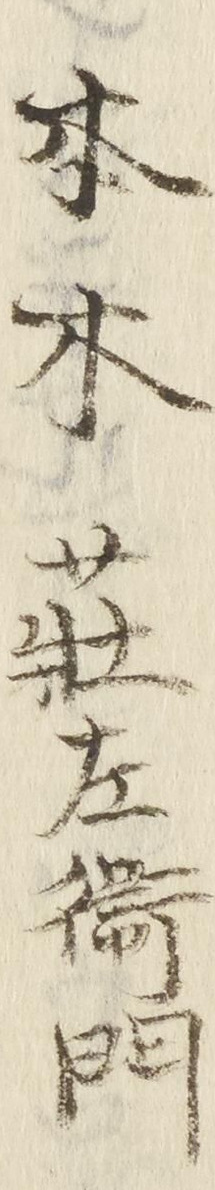本木荘左衛門
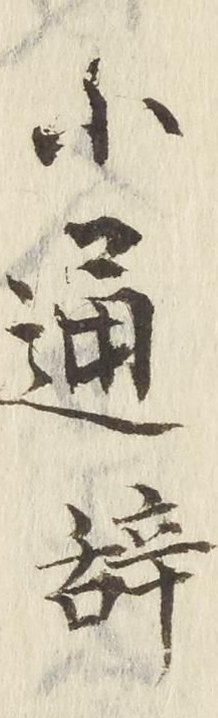小通辞
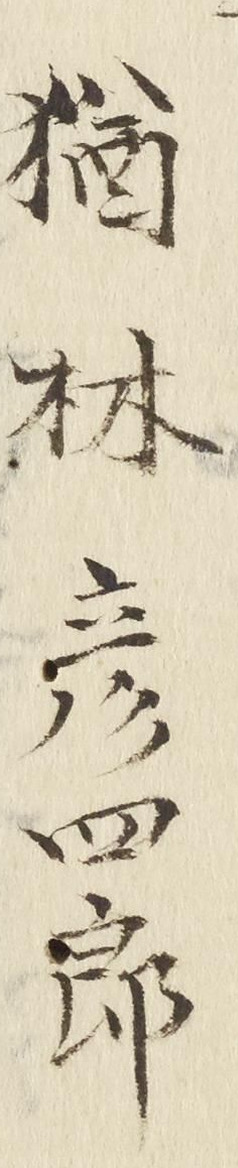楢林彦四郎
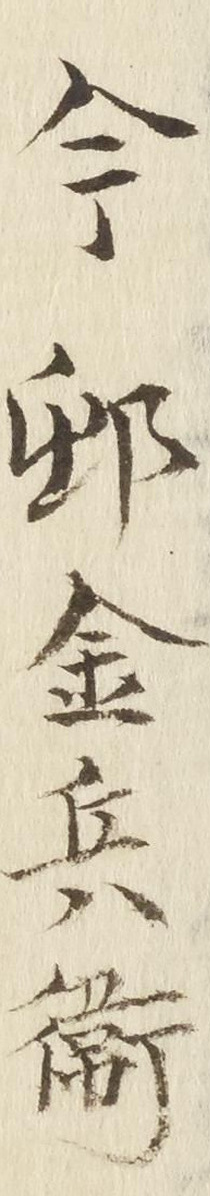今邨金兵衛
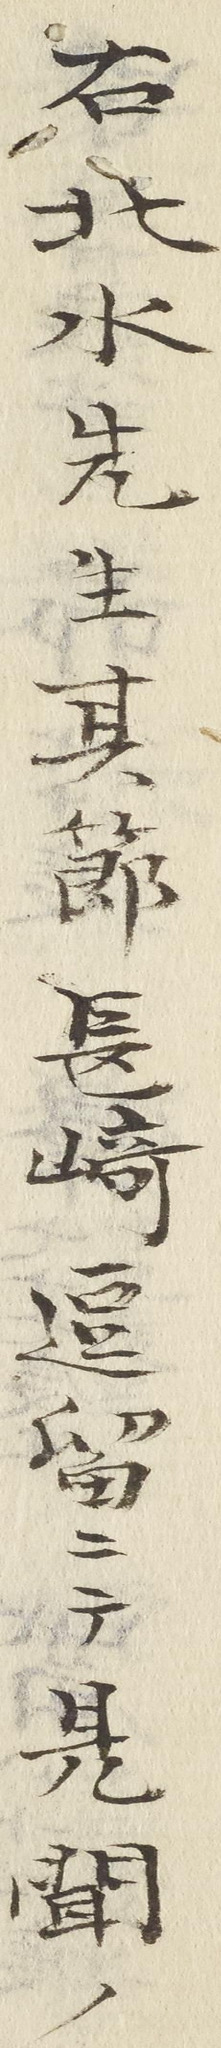右北水先生其節長崎逗留ニテ見聞ノ
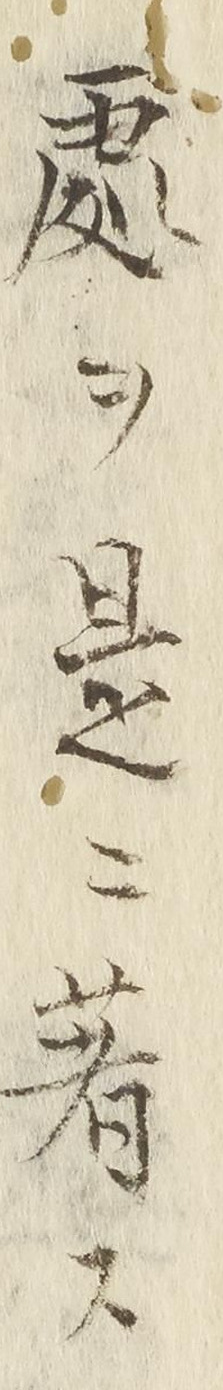処ヲ是ニ著ス
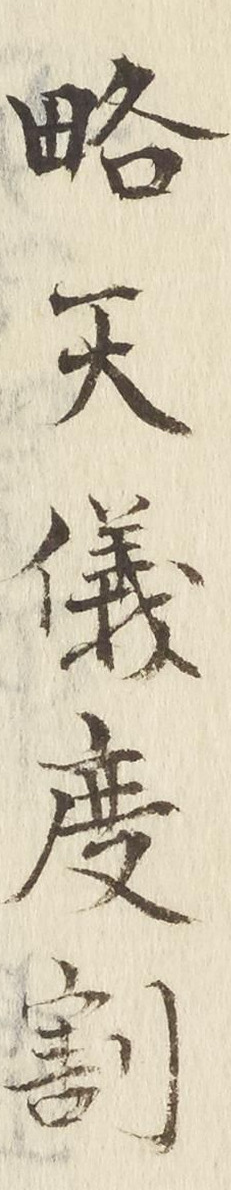略天儀度割
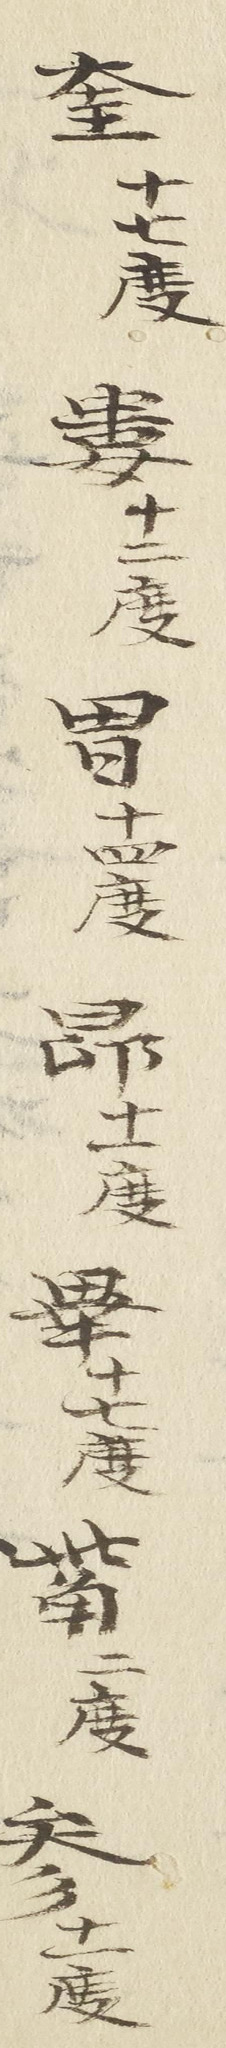奎十七度婁十二度胃十四度昴十一度畢十七度觜二度参十一度

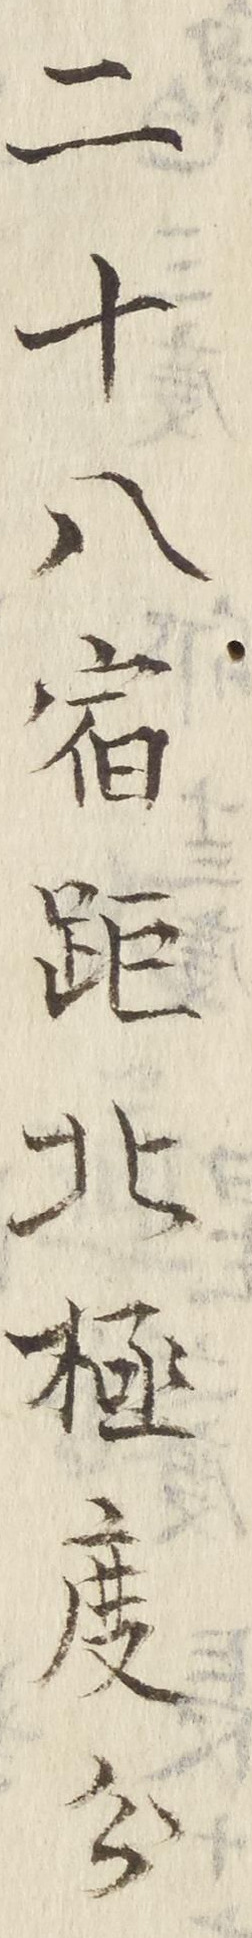二十八宿距北極度分
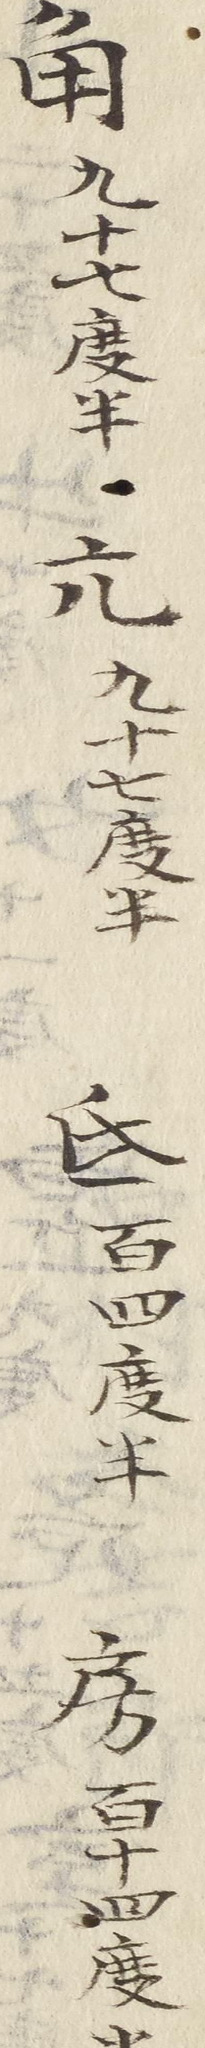角九十七度半亢九十七度半氐百四度半房百十四度半
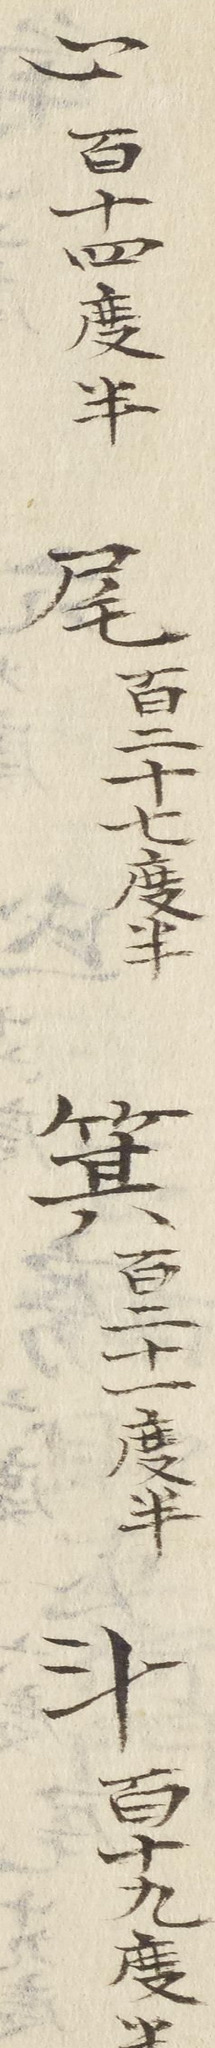心百十四度半尾百二十七度半箕百二十一度半斗百十九度半
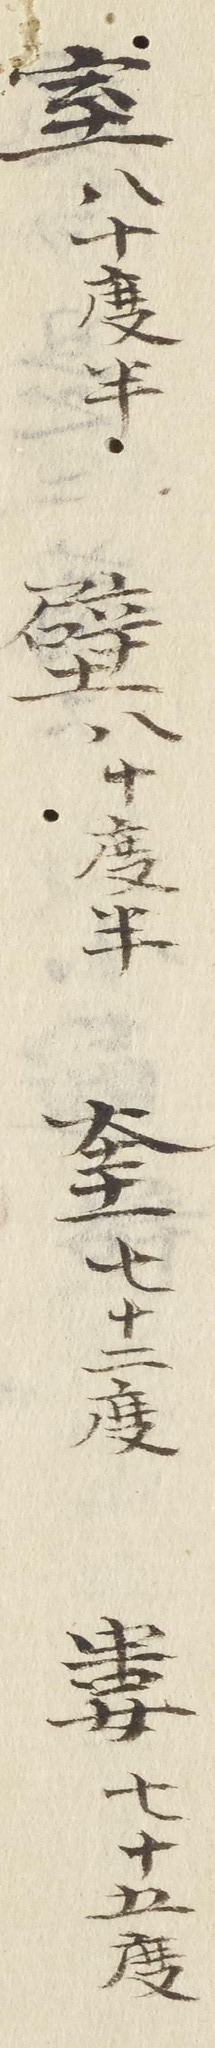室八十度半壁八十度半奎七十二度婁七十五度
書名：天象話説
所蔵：東京大学地震研究所図書室 Earthquake Research Institute Library, The University of Tokyo, JAPAN
